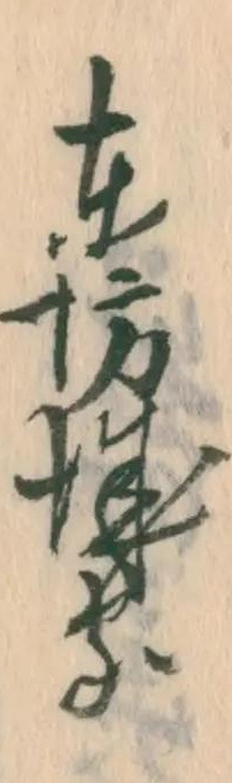東坊城家
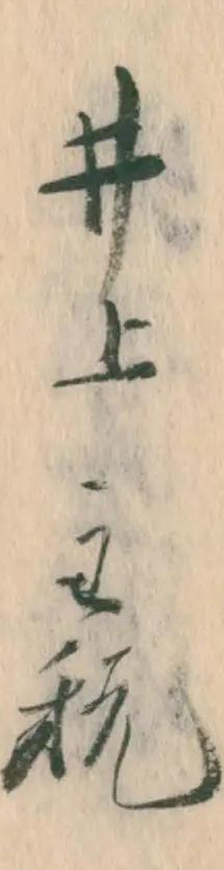井上主税
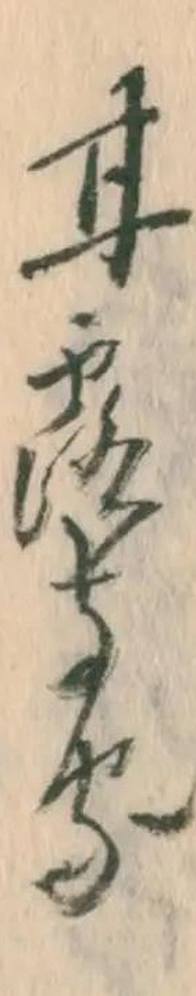甘露守家
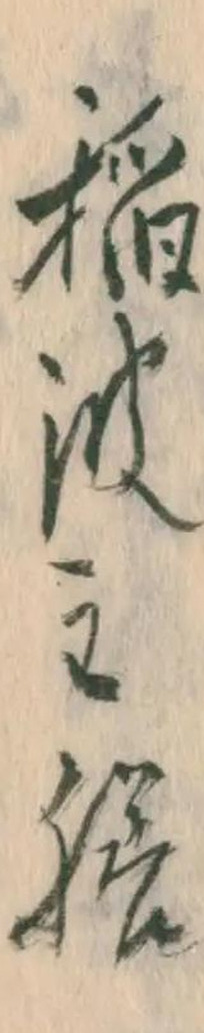稲波主膳
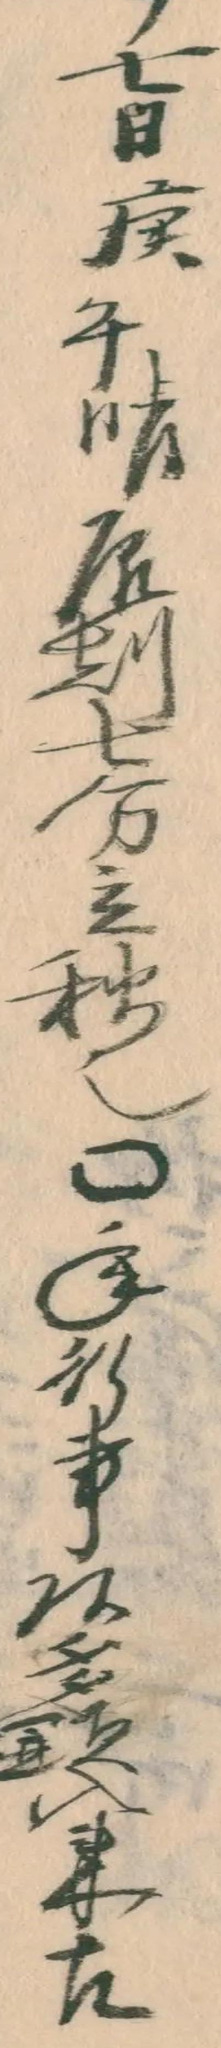十七日庚午晴辰刻七分立秋也○年行事頭多顕入来左
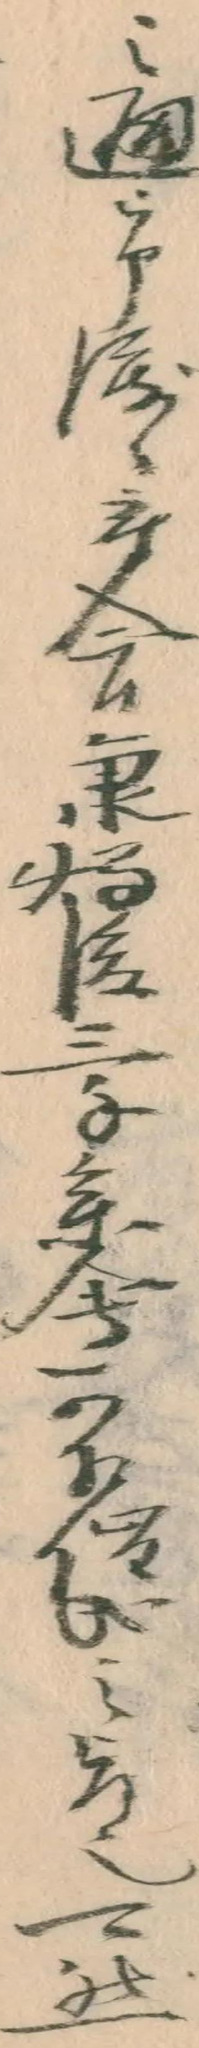之通被申渡候ニ付今日秉燭後三手参會可相催候之旨也可然
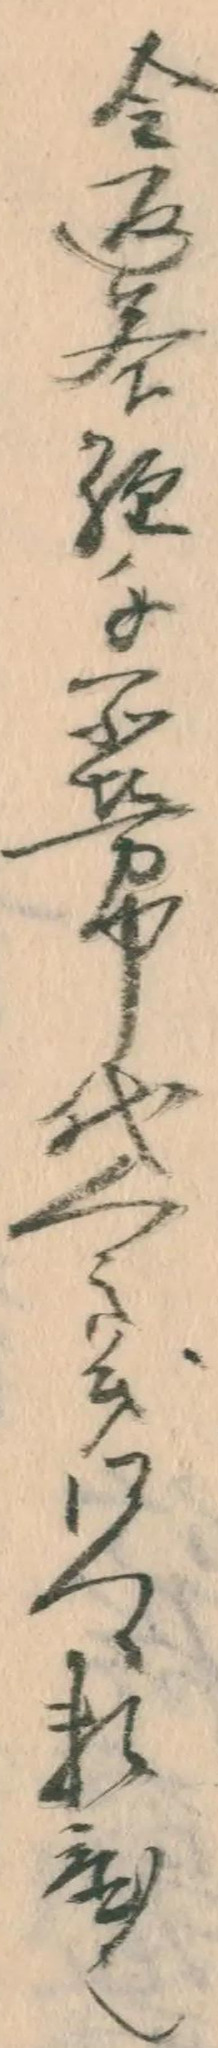令返答経千所労中代人之義同人へ頼置也
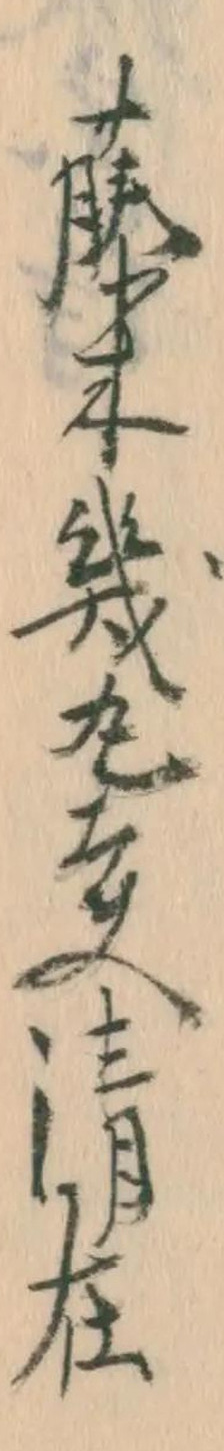藤木幾丸大夫清在
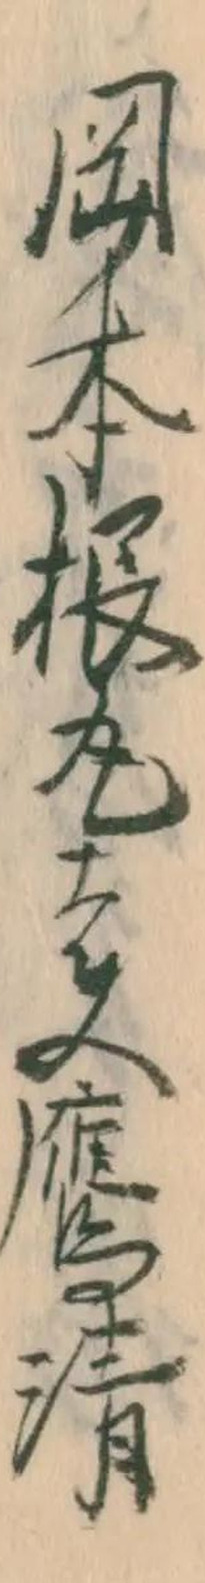岡本根丸大夫鷹清
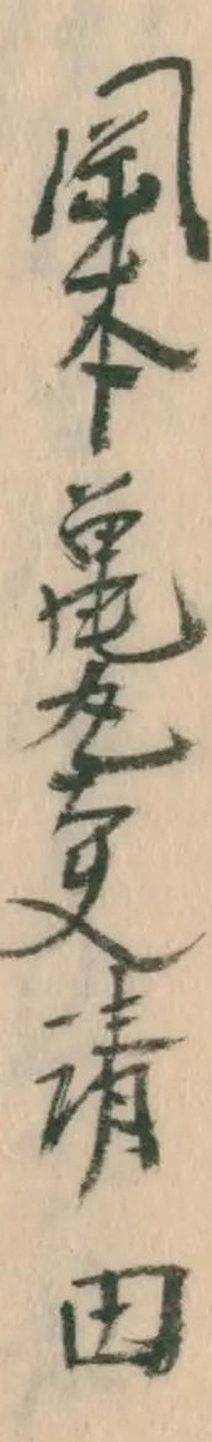岡本亀丸大夫清田
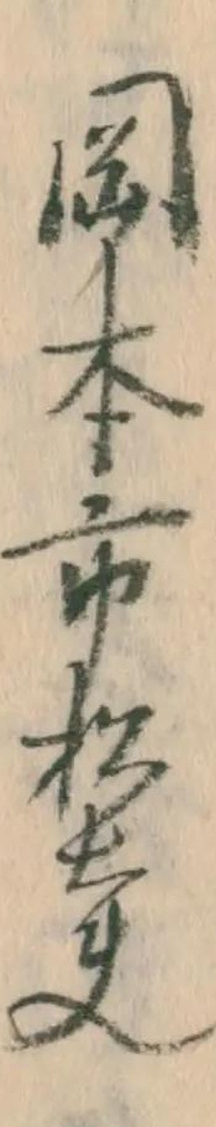岡本市松大夫
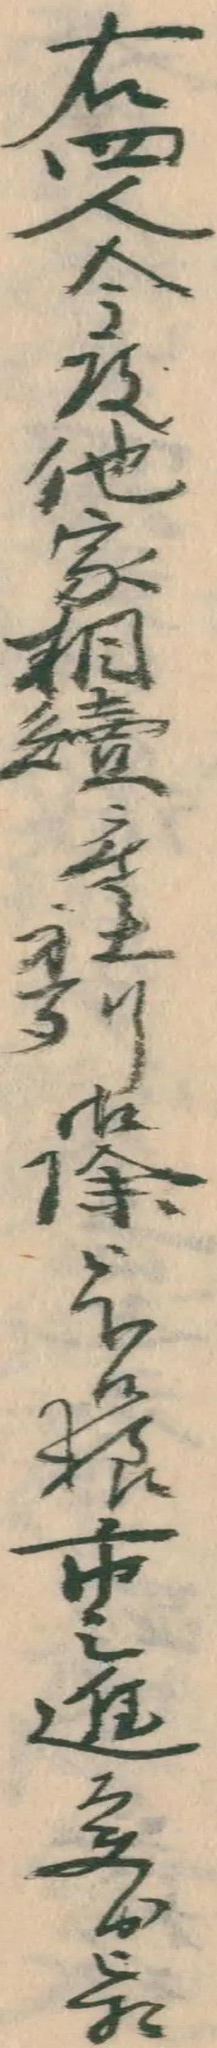右四人今度他家相續ニ付社列御除被下候様市之進大夫ゟ被相
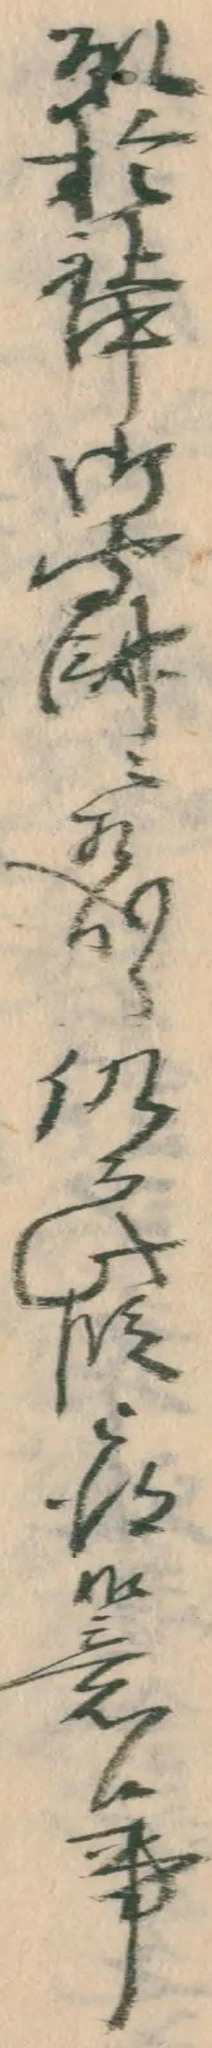願於社中御聞済ニ相成候仍而此段被得御意候事
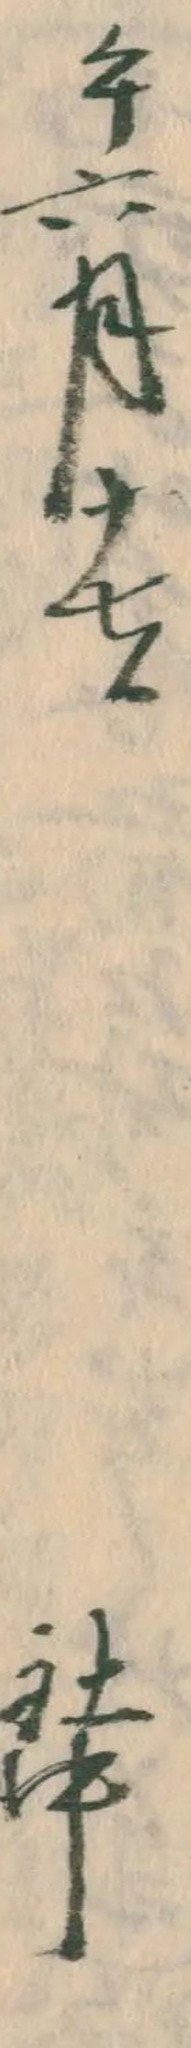午六月十七日社中
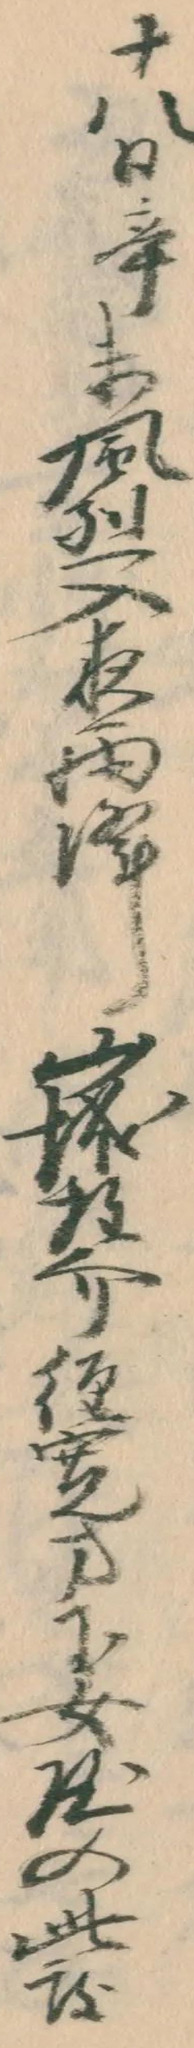十八日辛未風烈入夜雨降山城権介経寛方下女屋の此度
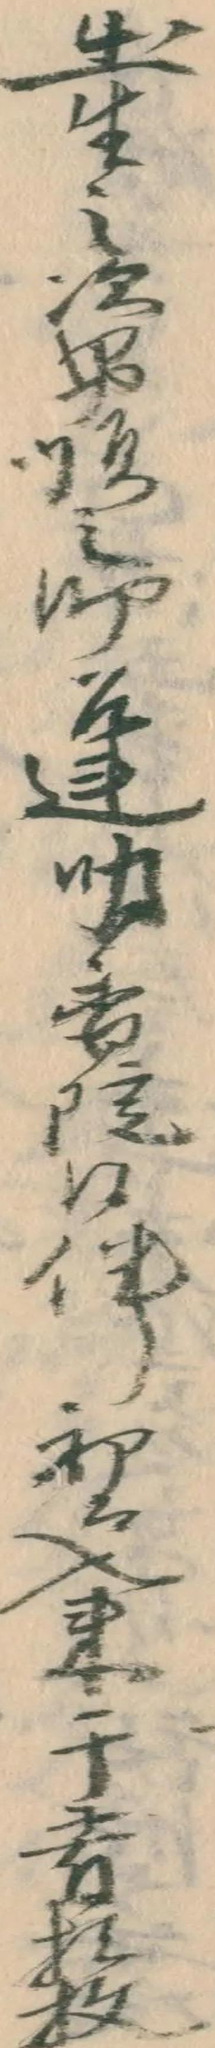出生之次男順之助召連明香院同伴初而入来干肴数枚
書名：賀茂社記録. 第70冊
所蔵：国立国会図書館 National Diet Library, JAPAN
